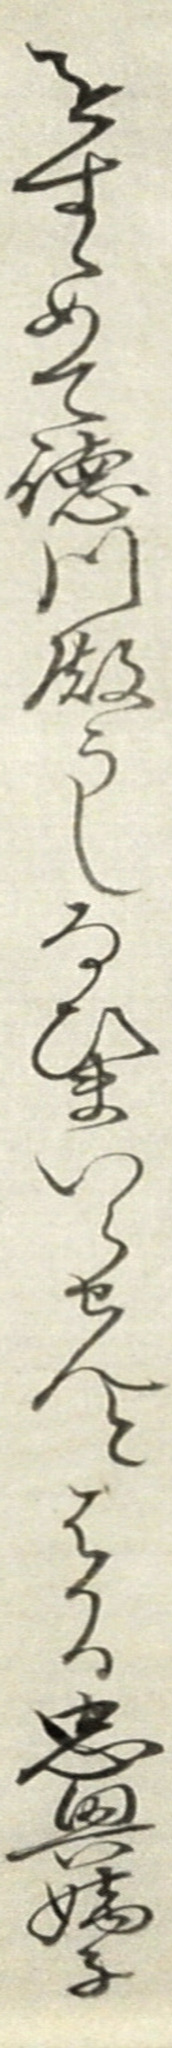をすゝめて徳川殿うしなひまいらせんとはかる忠興嫡子
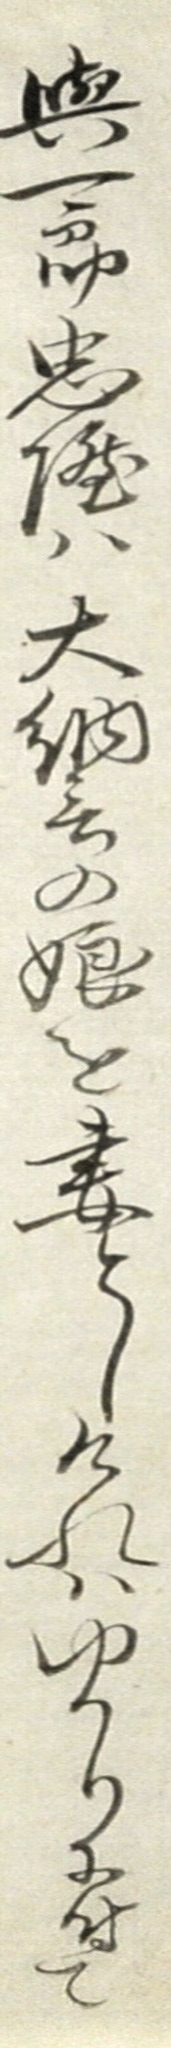與一郎忠隆は大納言の娘を妻としけれはゆかりに付て
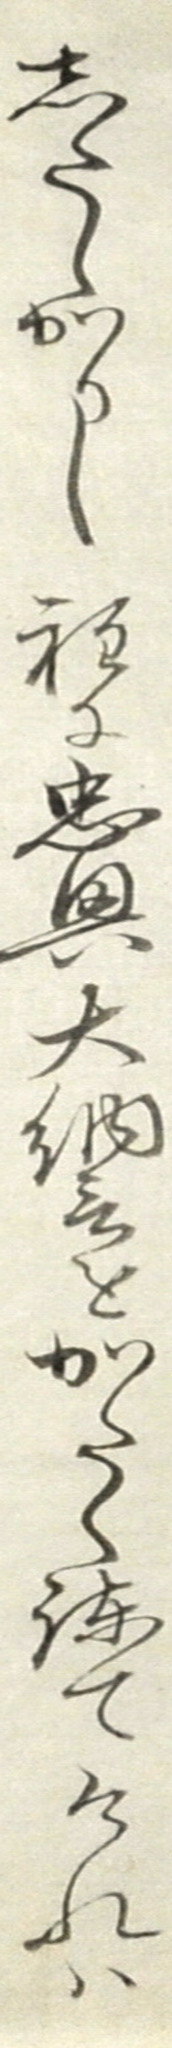したしかりし程に忠興大納言をかたく諫てけれは
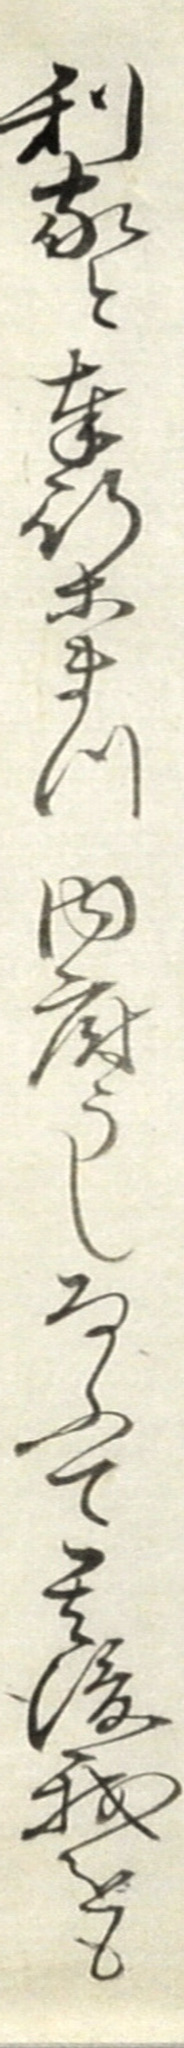利家と奉行等まつ内府うしなふて其後我をも
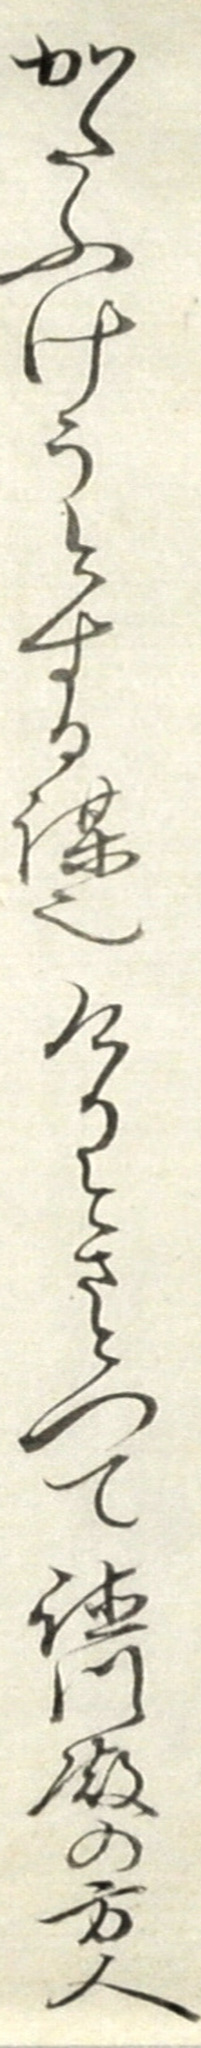かたふけうとする謀也けりとさとつて徳川殿の方人
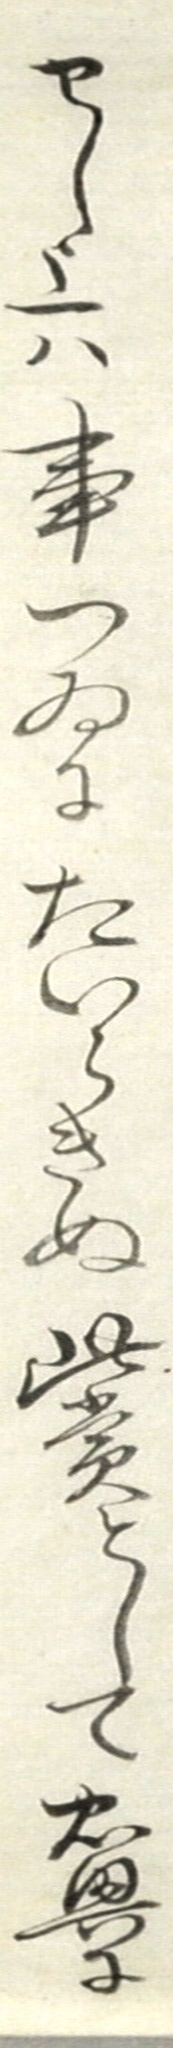せし上は事つゐにたいらきぬ此賞として忠興に

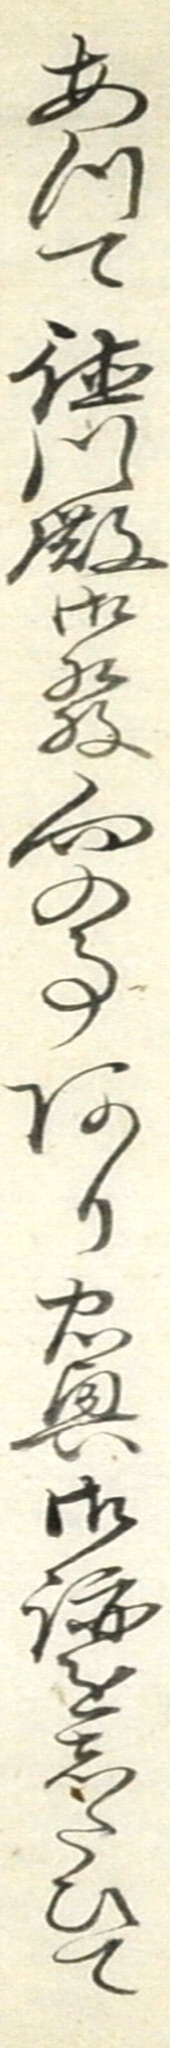あつて徳川殿御発向の事あり忠興御跡をしたひて
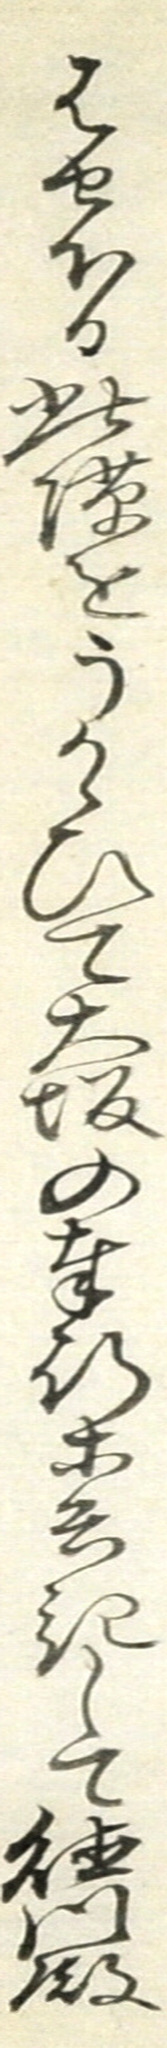はせ下る此隙をうかゝひて大坂の奉行等兵起して徳川殿
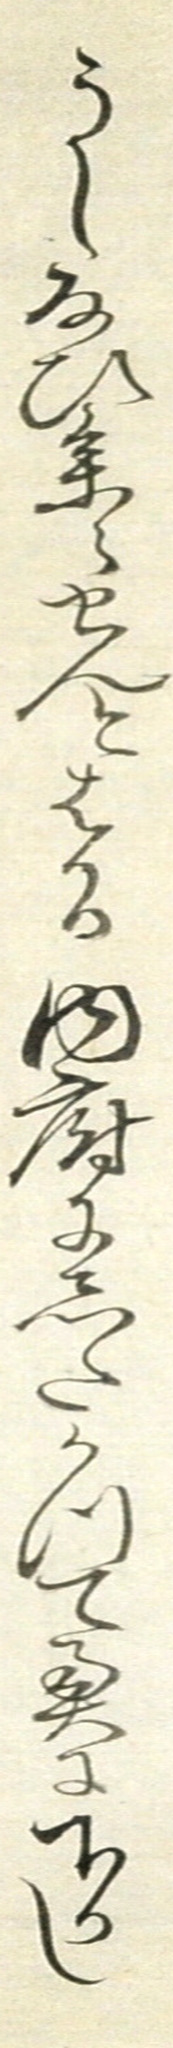うしなひ参らせんとはかる内府にしたかつて奥に下りし
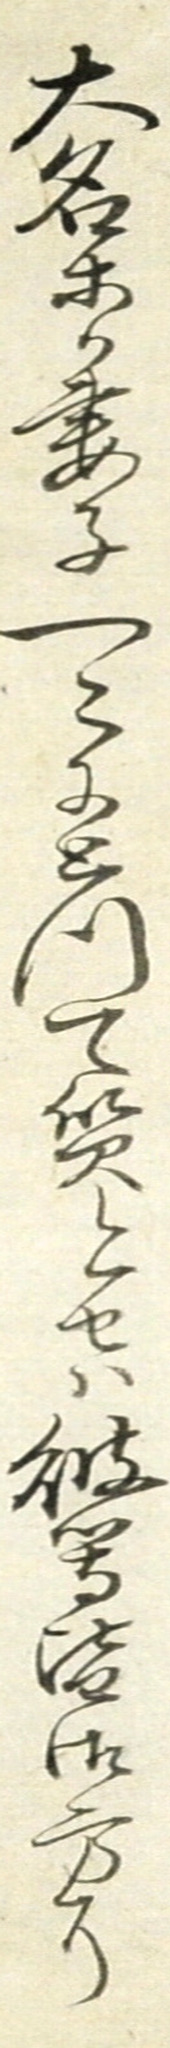大名等か妻子一々にとつて質とせは彼等皆御方に
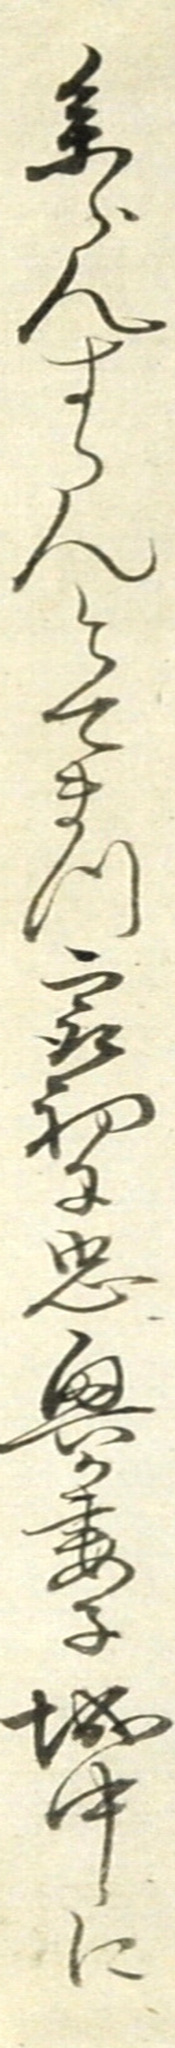参らんすらんとてまつ最初に忠興か妻子城中に
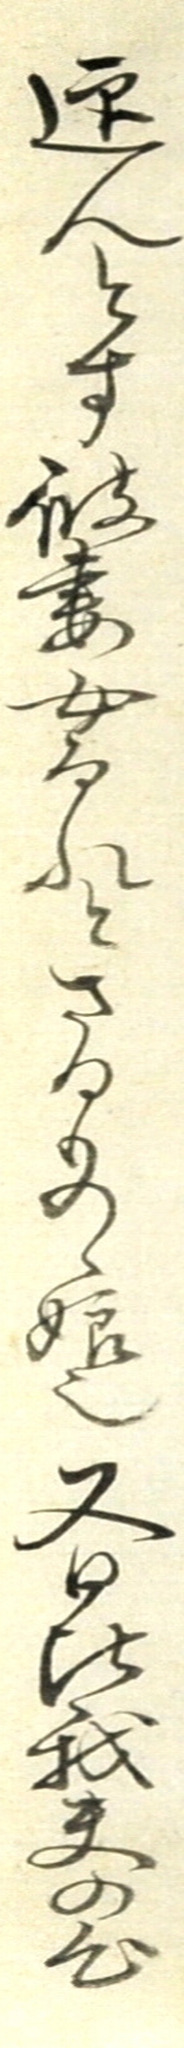迎んとす彼妻女なれとさるものゝ娘也又日比我夫の心

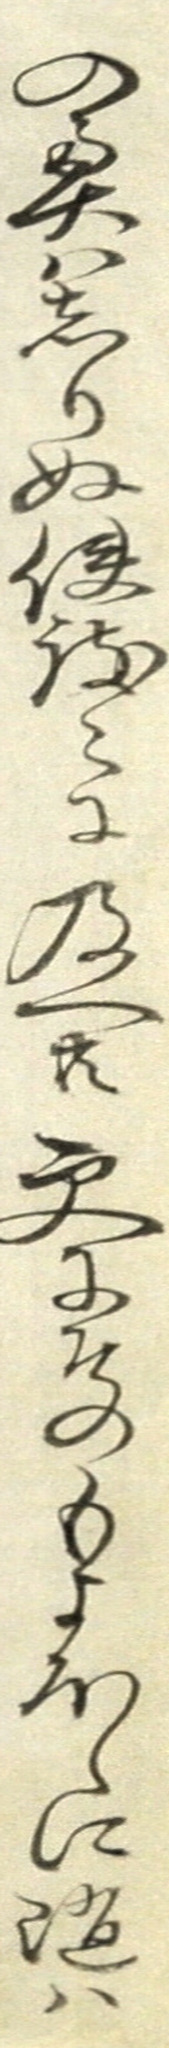の奥はしりぬ使度々に及へ共更にそのもよほしに随は
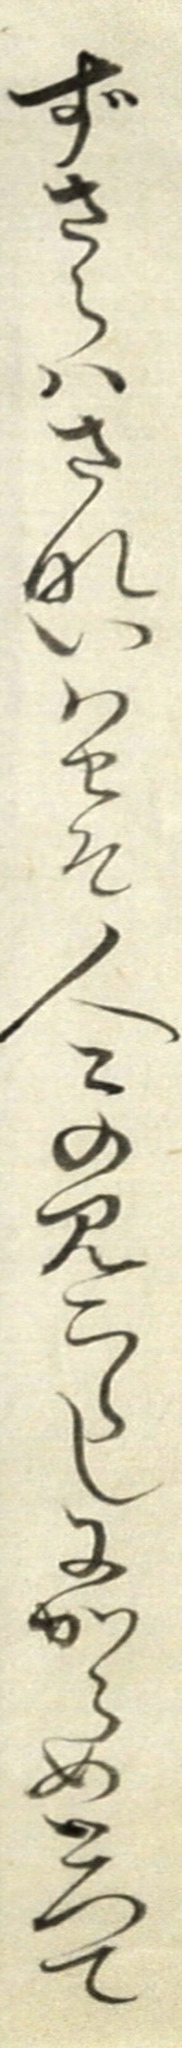ずさらはさないはせそ人々の見こらしにからめとつて
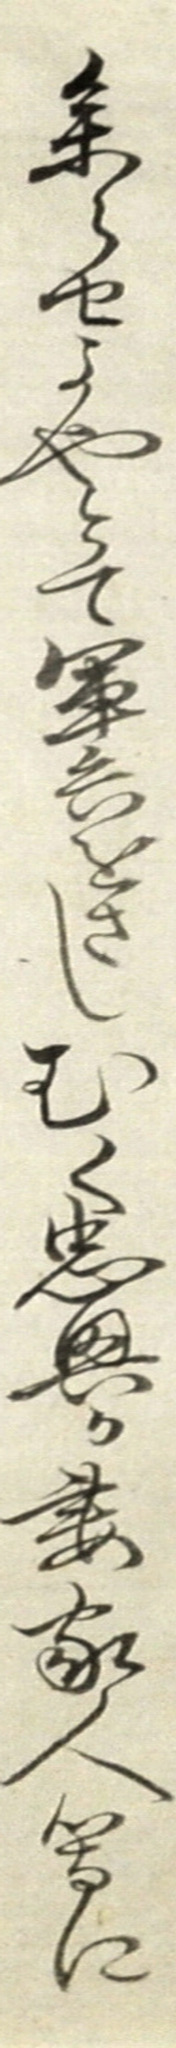参らせよやとて軍兵をさしむく忠興か妻家人等に
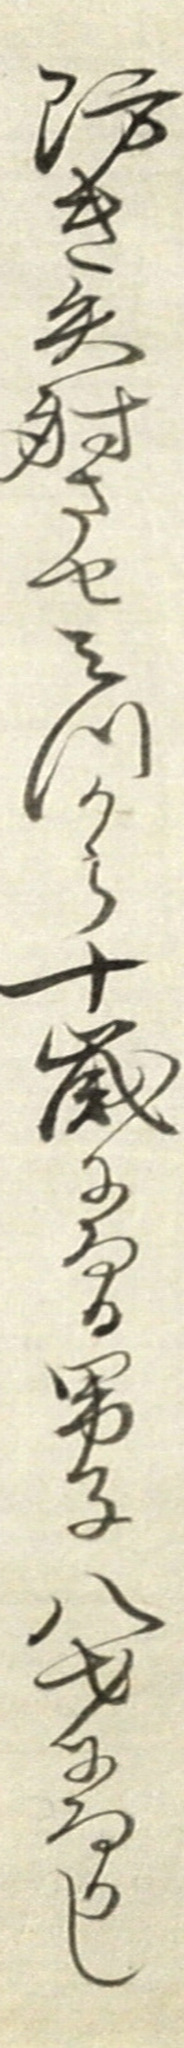防き矢射させみつから十歳になる男子八才になりし
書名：藩翰譜（七・下）
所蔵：伊那市立高遠町図書館・合同会社AMANE
